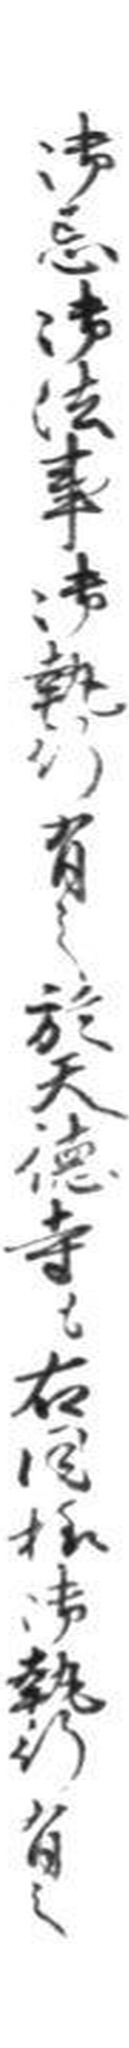御忌御法事御執行有之於天徳寺も右同様御執行有之
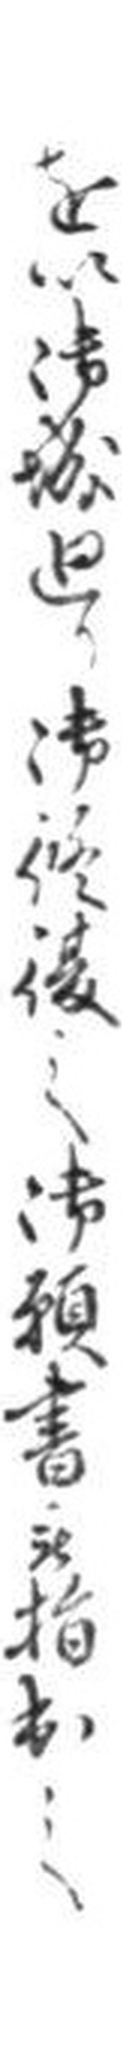を以御城廻り御修復之御願書被指出之
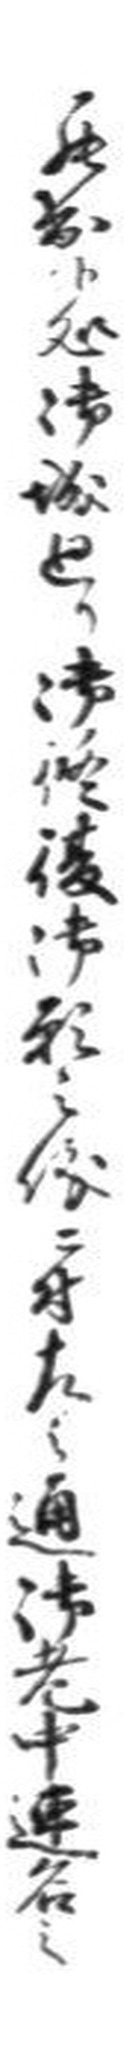罷出候処御城廻り御修復御願之儀ニ付左之通御老中連名之
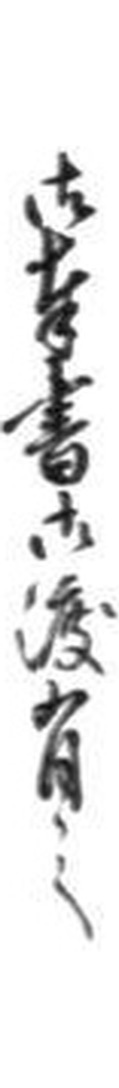御奉書御渡有之
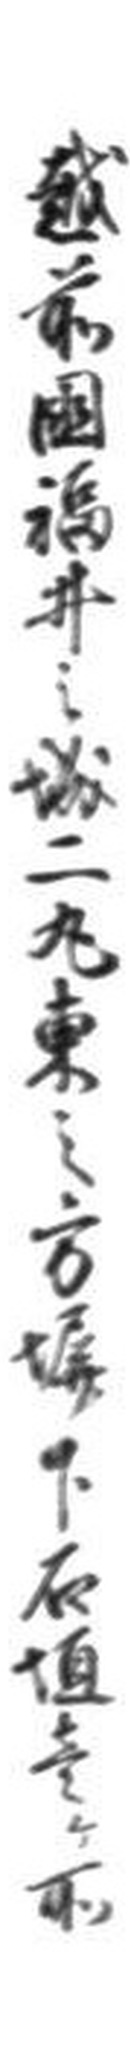越前国福井之城二丸東之方塀下石垣壱ケ所
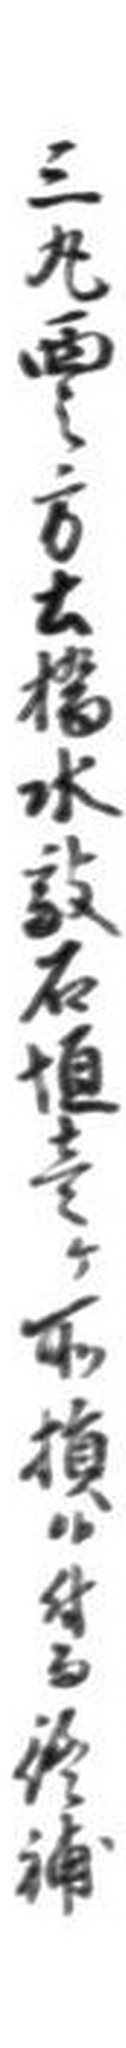三丸西之方土橋水敲石垣壱ケ所損候付而修補
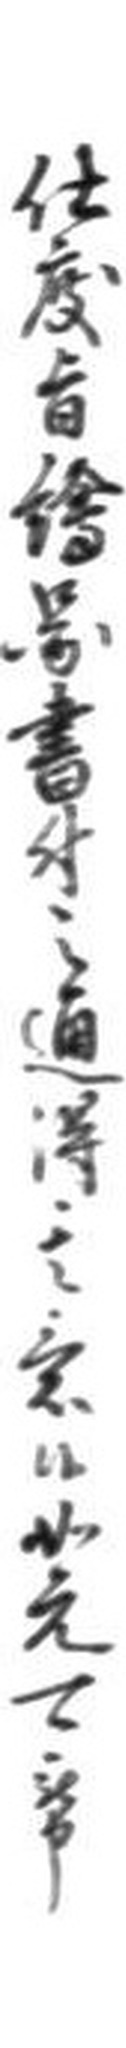仕度旨絵図書付之通得其意候如元可被申
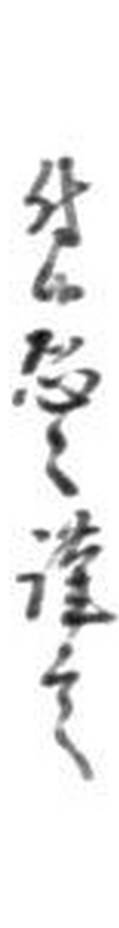付候恐々謹言
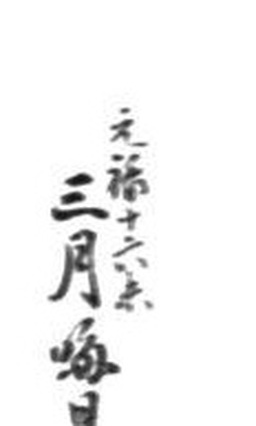元禄十六未
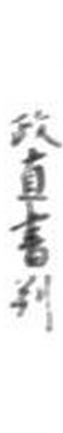政直書判
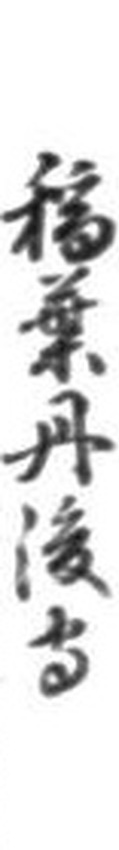稲葉丹後守
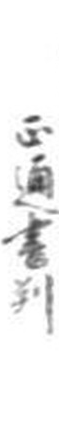正通書判
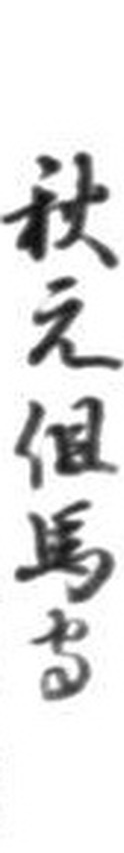秋元但馬守
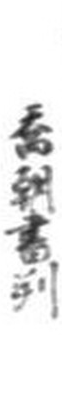喬朝書判

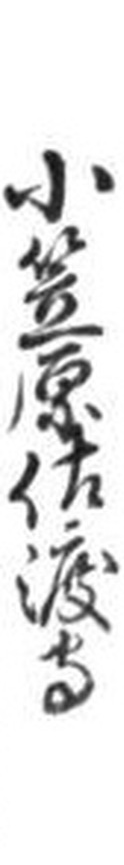小笠原佐渡守
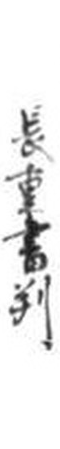長重書判
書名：家譜 二十二 吉品公 従元禄十五年到同十六年
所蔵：福井県文書館 Fukui Prefectural Archives
